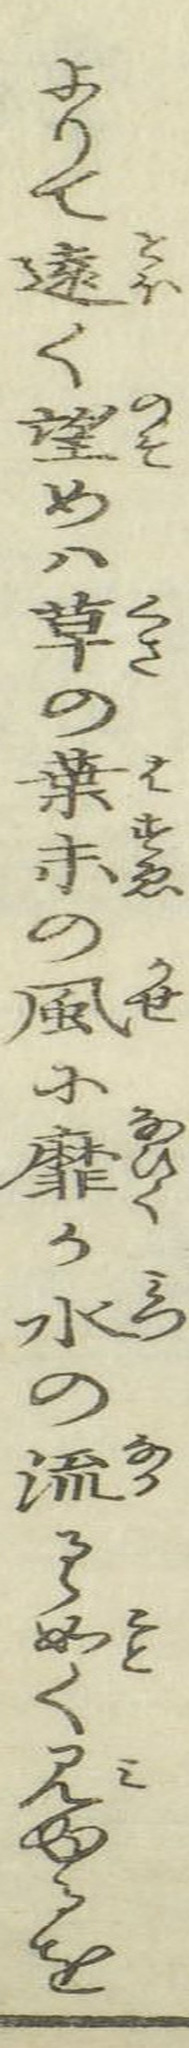よりて遠く望めは草の葉末の風に靡か水の流るゝ如く見ゆるを
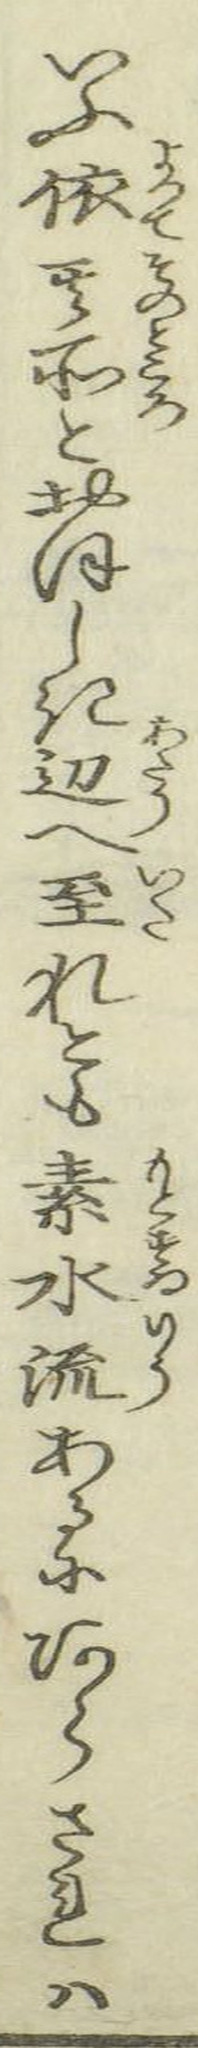いふ依其所とおほしき辺へ至れとも素水流あるにあらされは

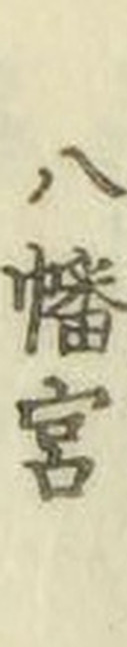八幡宮
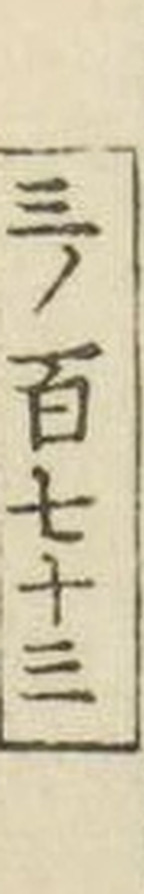三ノ百七十三

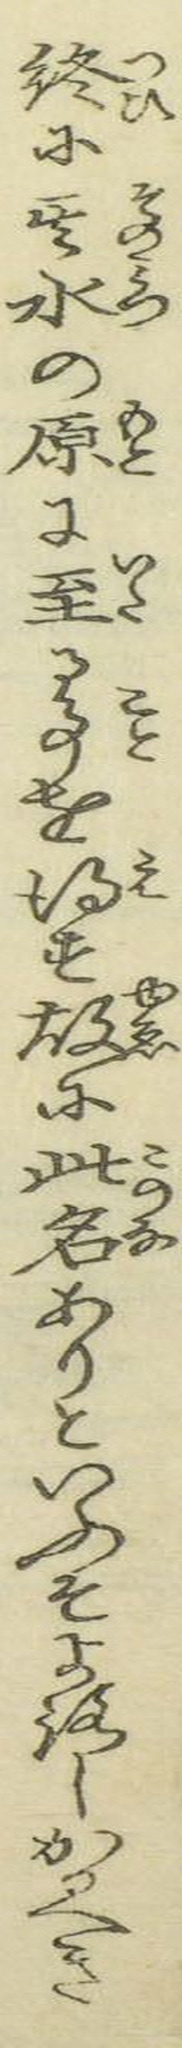終に其水の原に至る事を得す故に此名ありといふそよろしかるへき
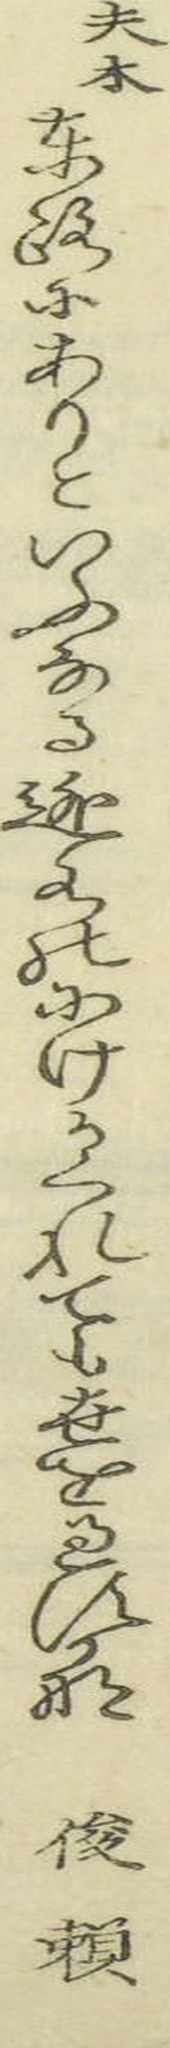夫木東路にありといふなる逃水のにけかくれても世を過すかな俊頼
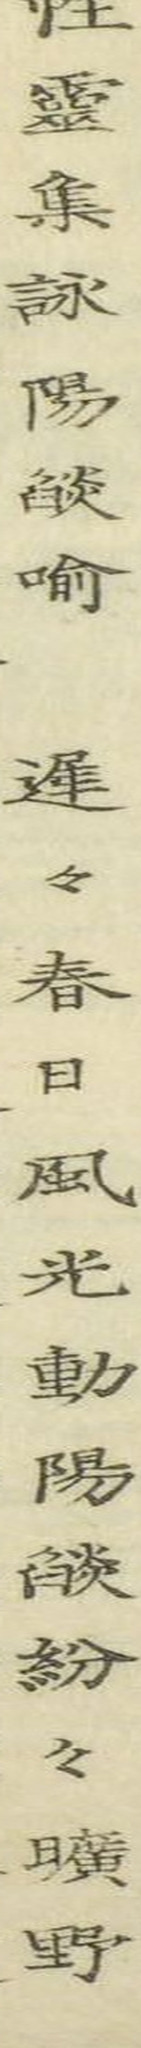性霊集詠陽燄喩遅々春日風光動陽燄紛々嚝野
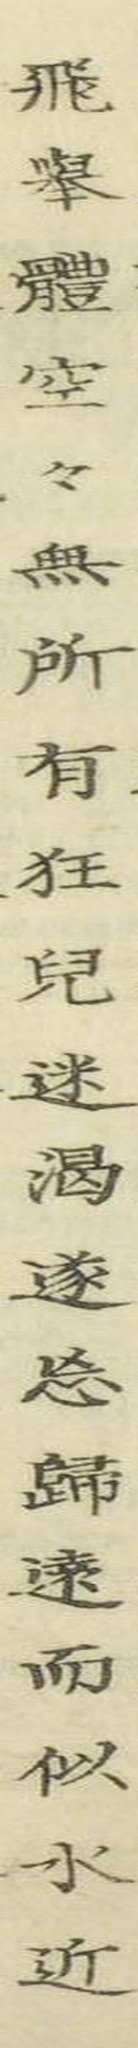飛舉體空々無所有狂児迷渇遂㤀帰遠而似水近
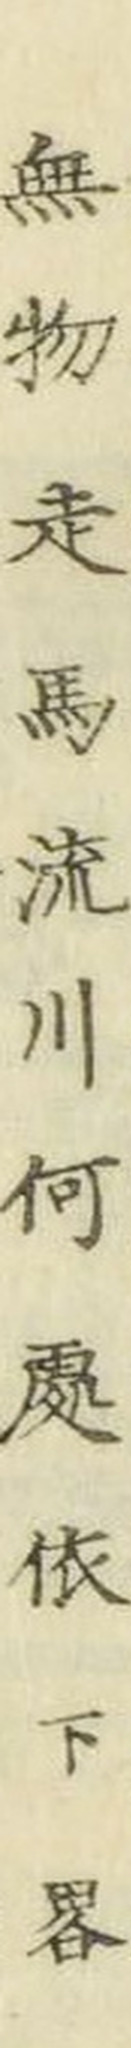無物走馬流川何処依下略
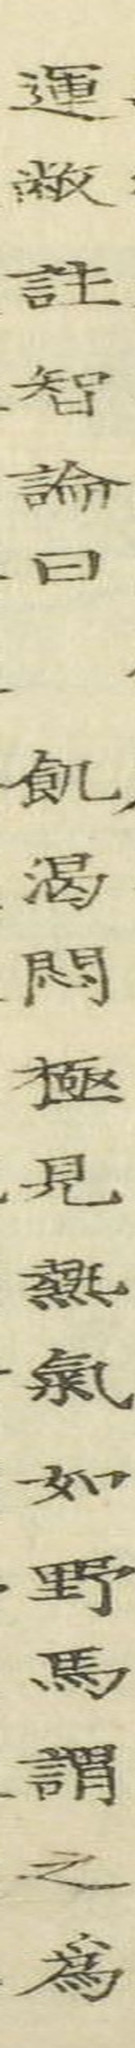運敝註智論曰飢渇悶極見熱気如野馬謂之為
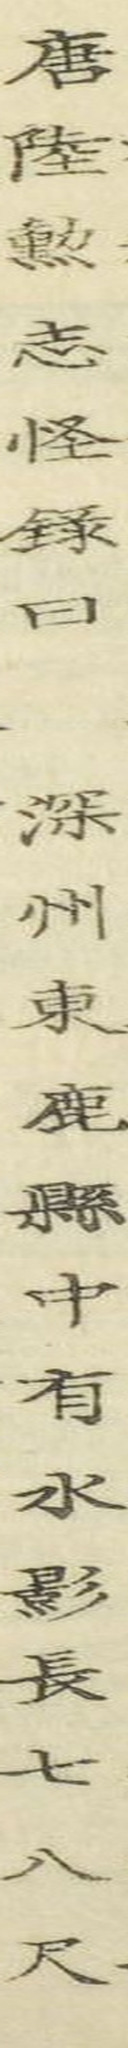唐陸勲志怪録曰深州東鹿県中有水影長七八尺
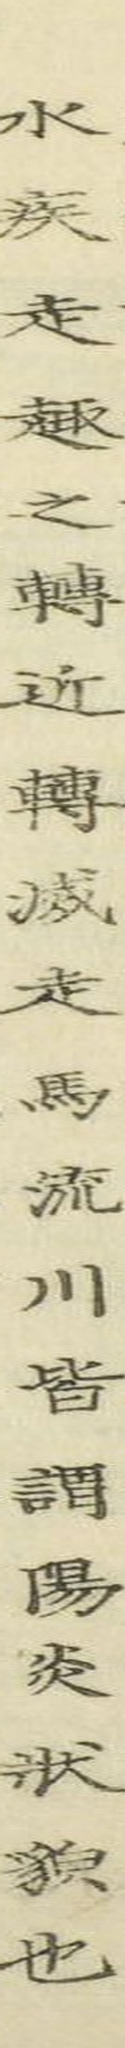水疾走趣之転近転滅走馬流川皆謂陽炎状貌也
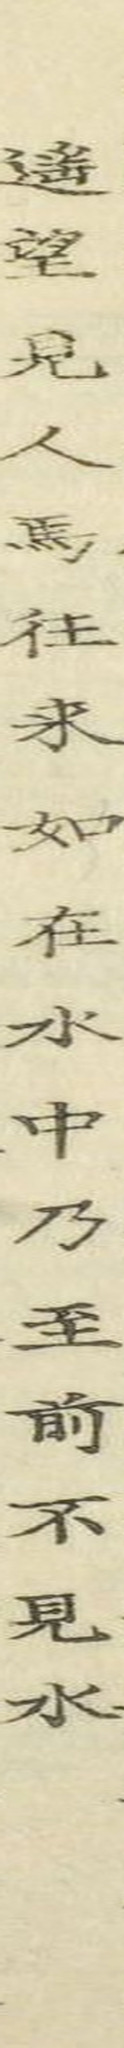遥望見人馬往来如在水中乃至前不見水
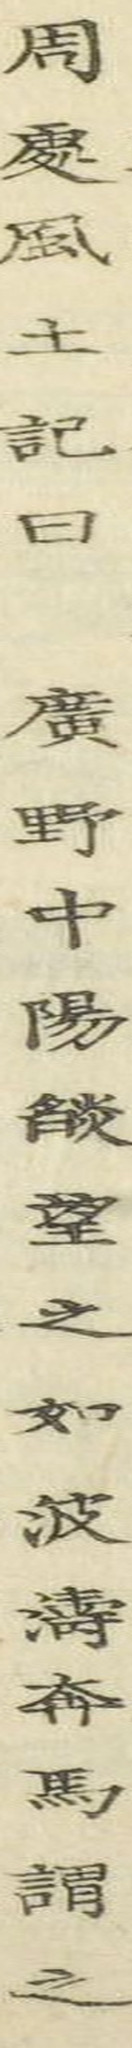周處風土記曰広野中陽燄望之如波濤奔馬謂之
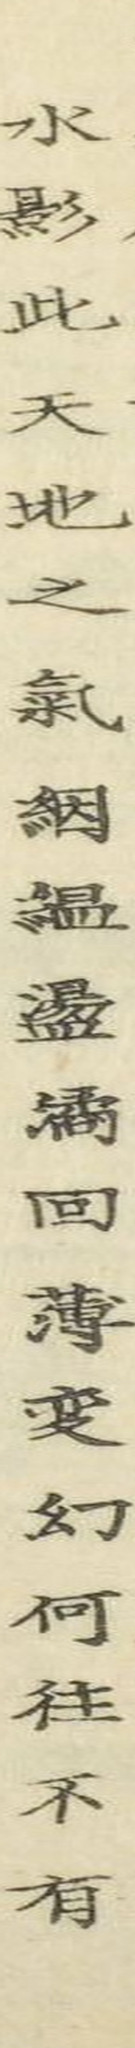水影此天地之気絪縕盪潏回薄変幻何往不有
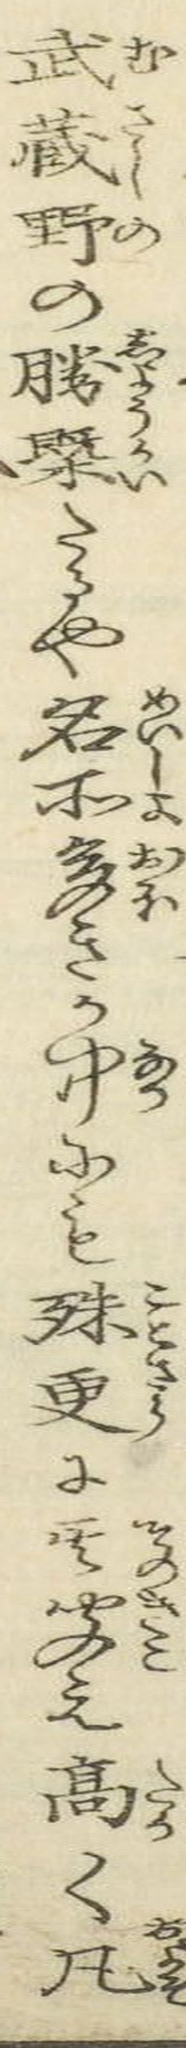武蔵野の勝槩たるや名所多きか中にも殊更に其聞え高く凡
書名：江戸名所図会 20巻 巻之9
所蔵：東京学芸大学教育コンテンツアーカイブ
